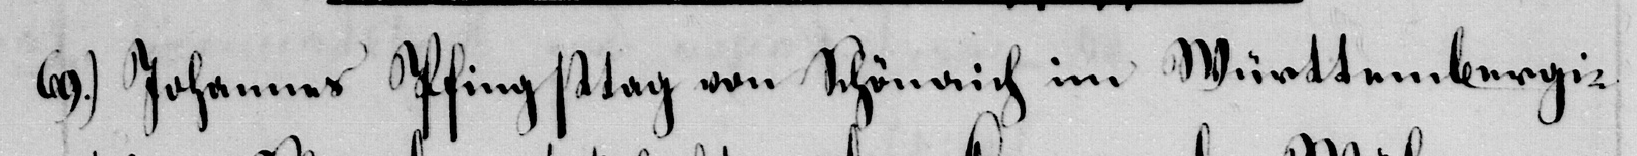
69.) Johannes Pfingsttag von Schönaich im Württembergi¬
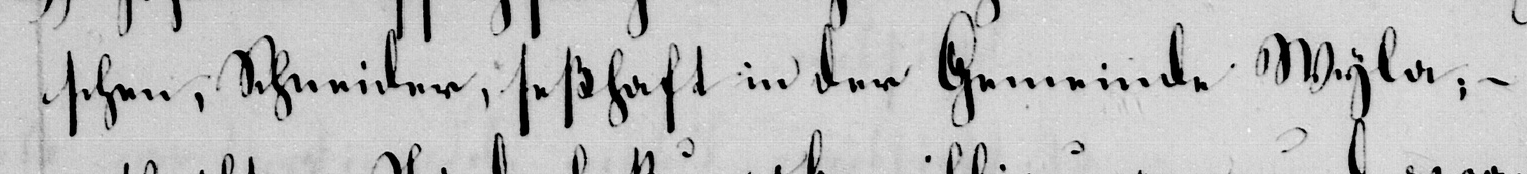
schen, Schneider, seßhaft in der Gemeinde Wyla;
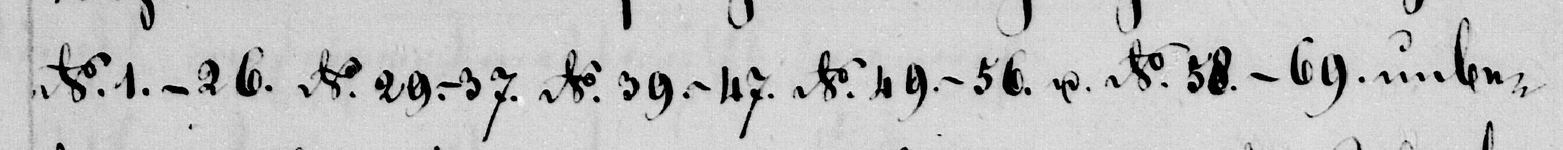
No. 1.–26. No. 29.–37. No. 39.–47. No. 49.–56. No. 58.–69. unbe¬
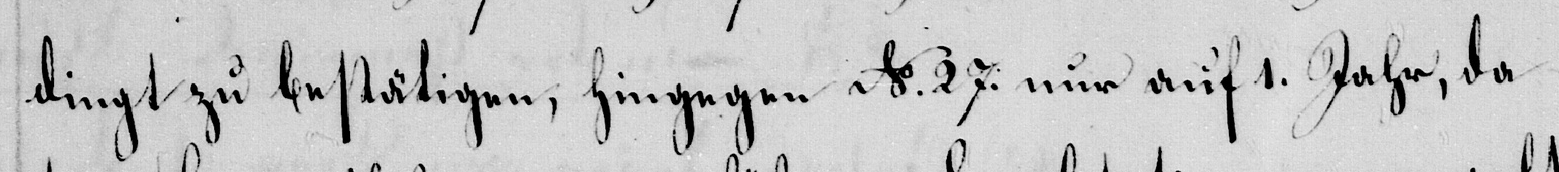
dingt zu bestätigen, hingegen No. 27. nur auf 1. Jahr, da
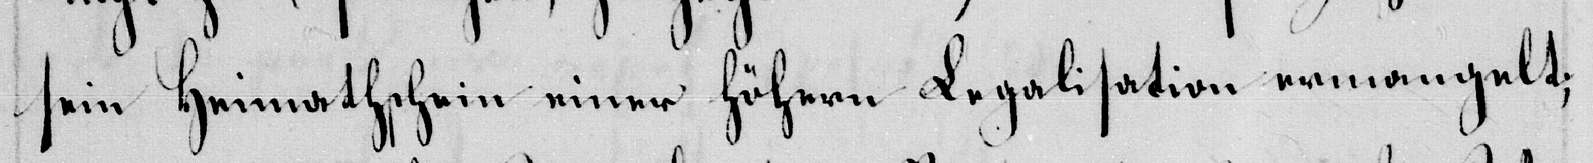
sein Heimathschein seiner höhern Legalisation ermangelt:
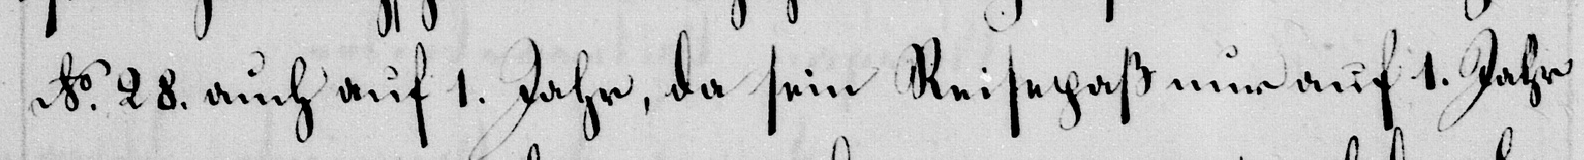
No. 28. auch auf 1. Jahr, da sein Reisepaß nur auf 1. Jahr
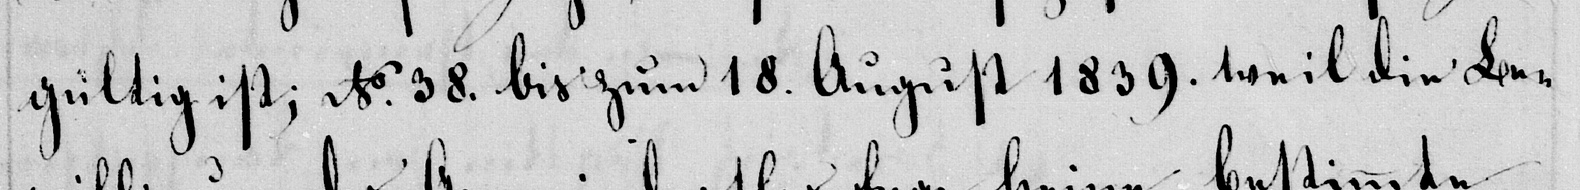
gültig ist; No. 38. bis zum 18. August 1839. weil die Be¬
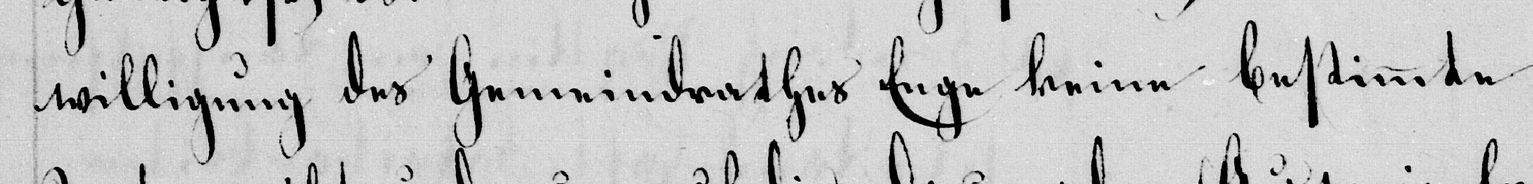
willigung des Gemeindrathes Enge keine bestimmte
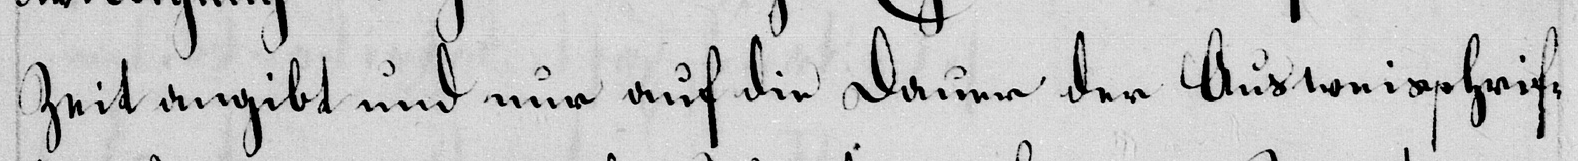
Zeit angibt und nur auf die Dauer der Ausweisschrif¬
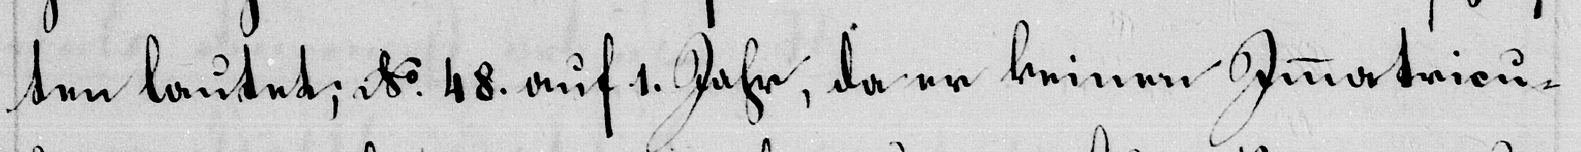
ten lautet, No. 48. auf 1. Jahr, da er keinen Immatricu¬
